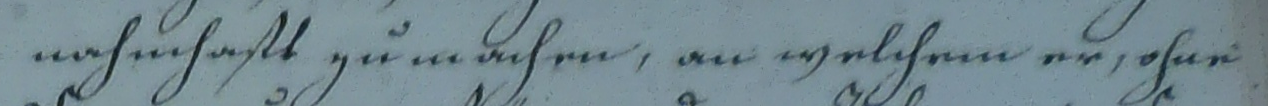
nahmhaft zu machen, an welchem er, ohne
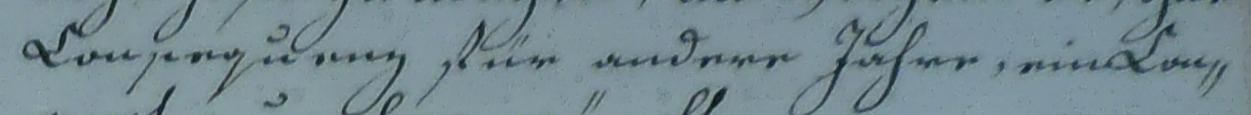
Consequenz für andere Jahre, ein Con¬
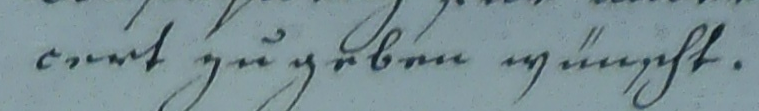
cert zugeben wünscht.
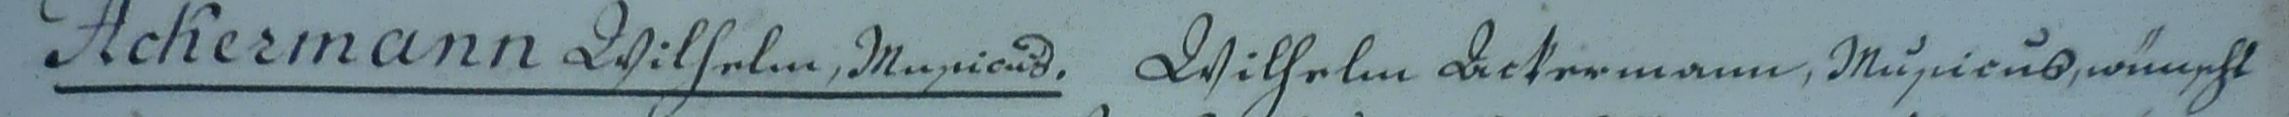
Ackermann Wilhelm, Musicus. Wilhelm Ackermann, Musicus, wünscht
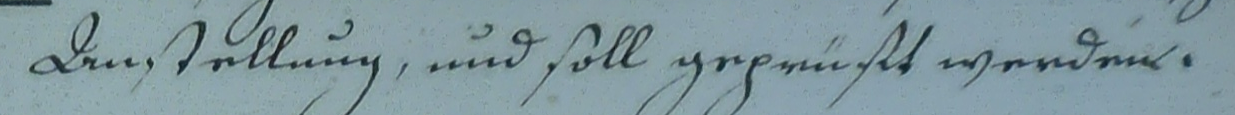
Anstellung, und soll geprüft werden.
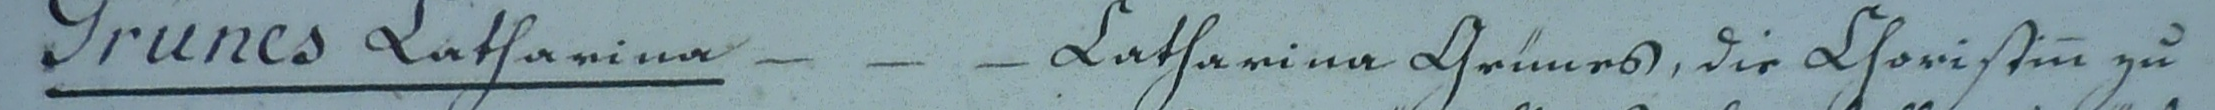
Grünes Catharina _ _ _ Catharina Grünes, die Choristin̅ zu
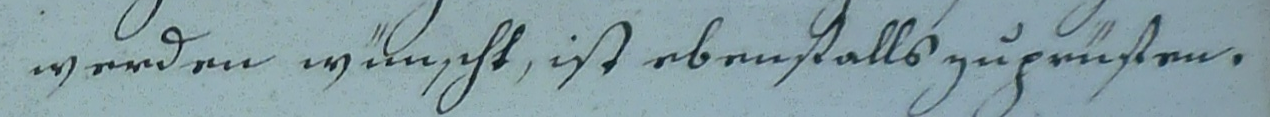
werden wünscht, ist ebenfalls zuprüfen.
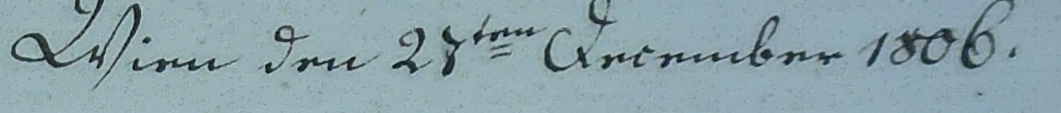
Wien den 27te͇n December 1806.
